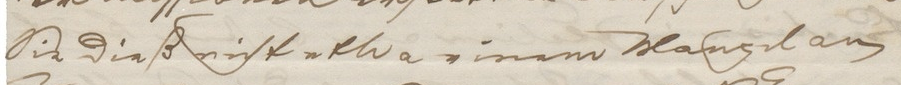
Sie dieß nicht etwa einem Mangel an
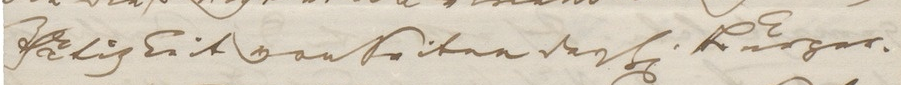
Thätigkeit von Seiten des H. Bürger-
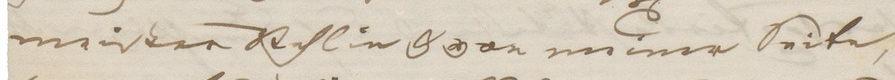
meister Stehlin & von meiner Seite,
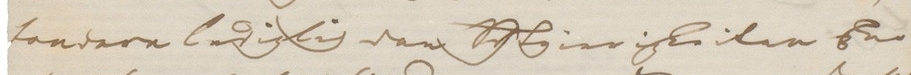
sondern lediglich den Schwierigkeiten zu-
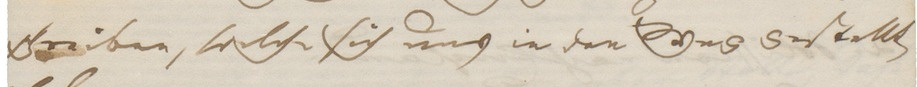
schreiben, welche sich uns in den Weg gestellt
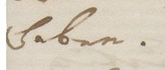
haben.
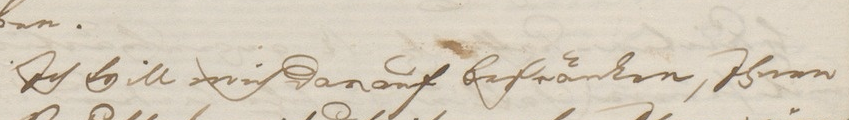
Ich will mich darauf beschränken, Ihnen
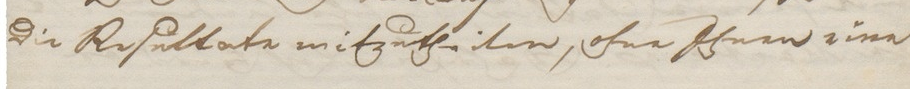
die Resultate mitzutheilen, ohne Ihnen eine
